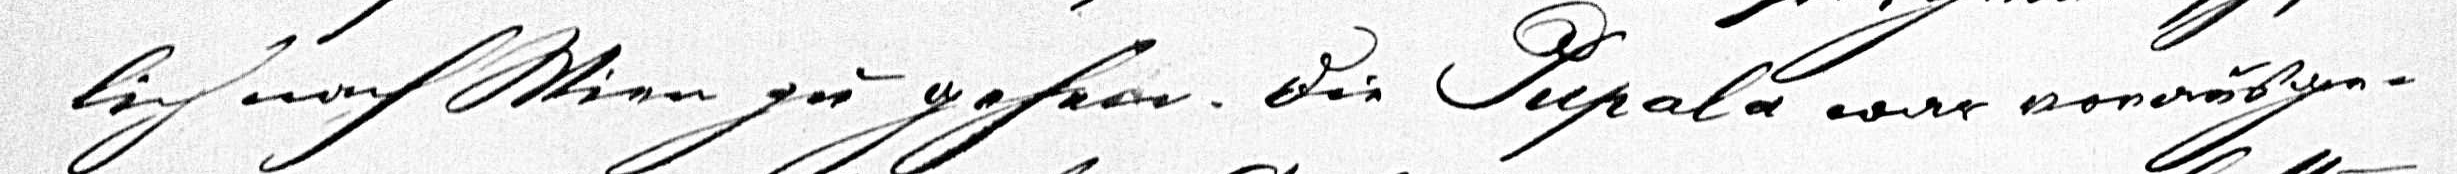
lich noch Wien zu gehen. Die Pupala war vorausge¬
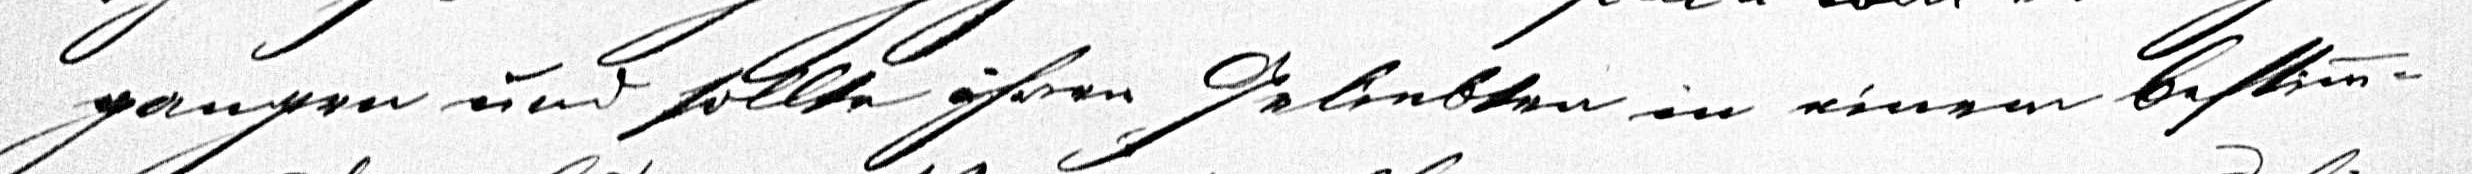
gangen und sollte ihren Geliebten in einem bestimm¬
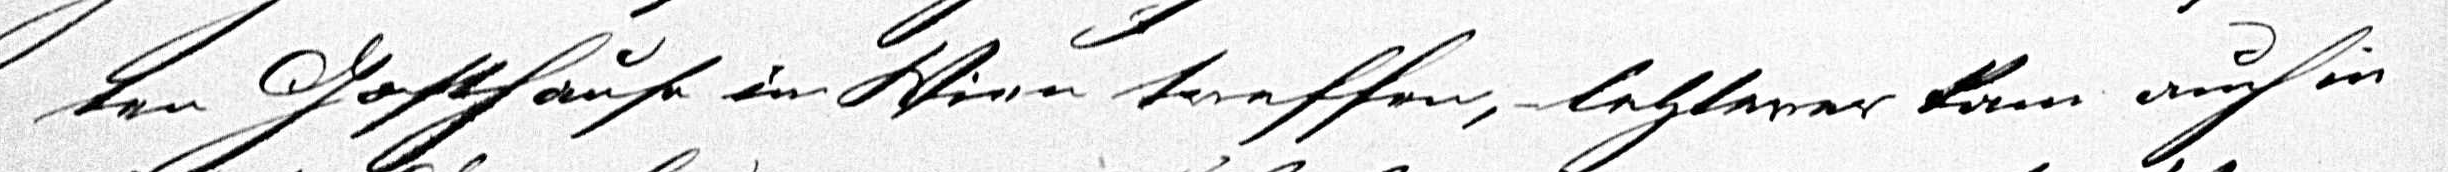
ten Gasthause in Wien treffen, letzterer kam auch in
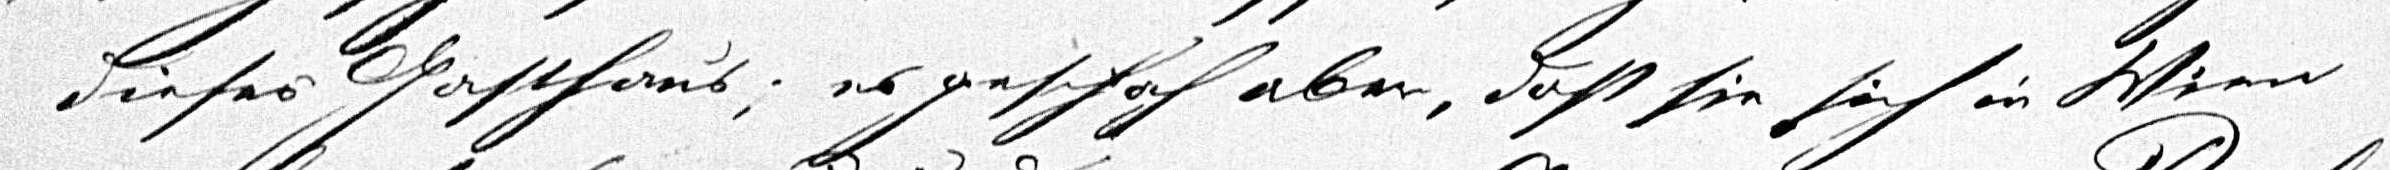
dieses Gasthaus; es geschah aber, daß sie sich in Wien
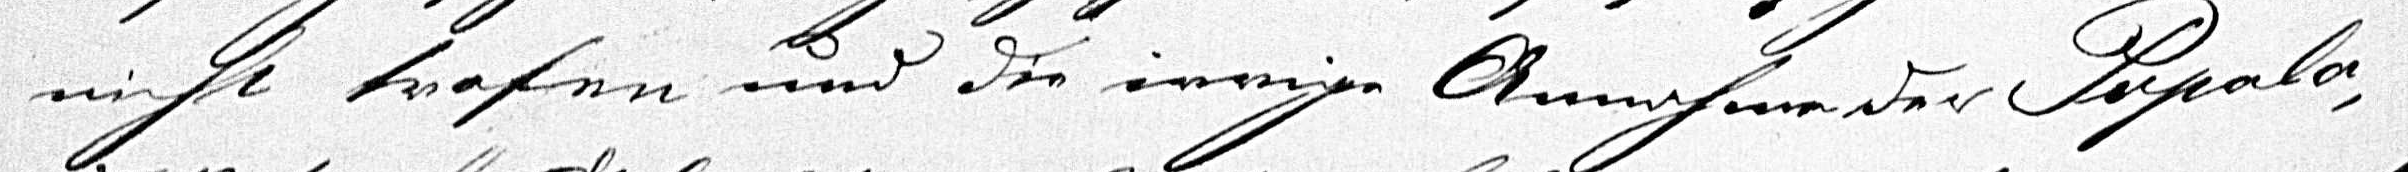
nicht trafen und die irrige Annahme der Pupala,
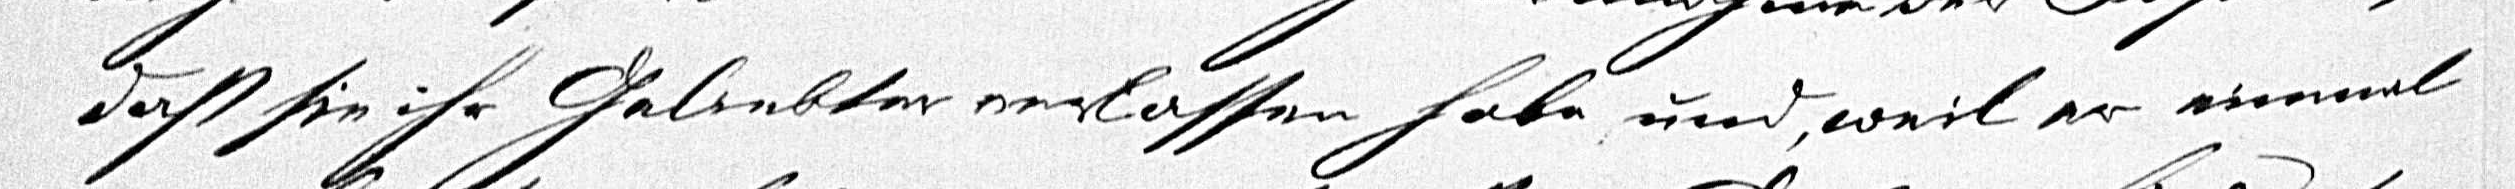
daß sie ihr Geliebten verlassen habe und weil er einmal
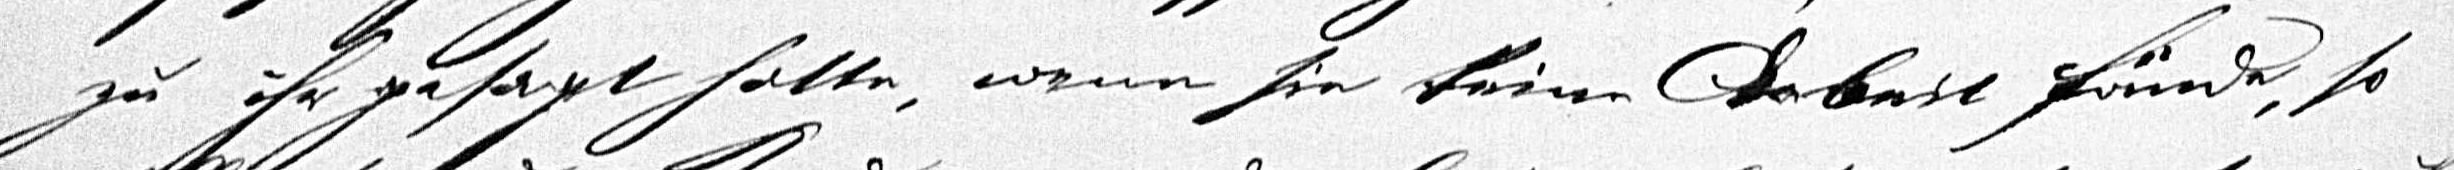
zu ihr gesagt hatte, wenn sie keine Arbeit fände, so
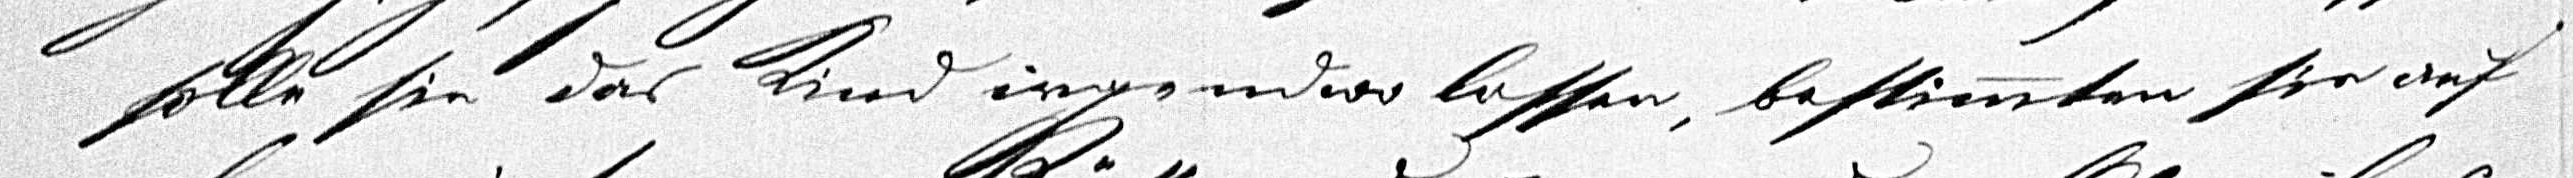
solle sie das Kind irgendwo lassen, bestimmten sie auf
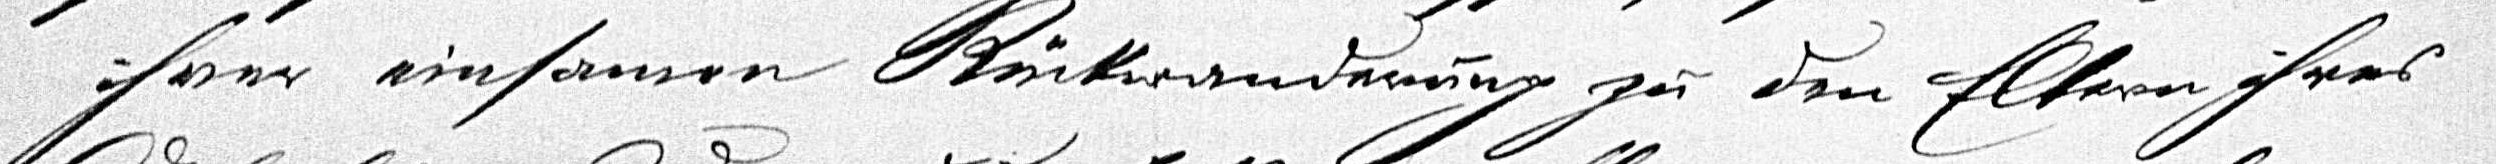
ihrer einsamen Rückwanderung zu den Eltern ihres
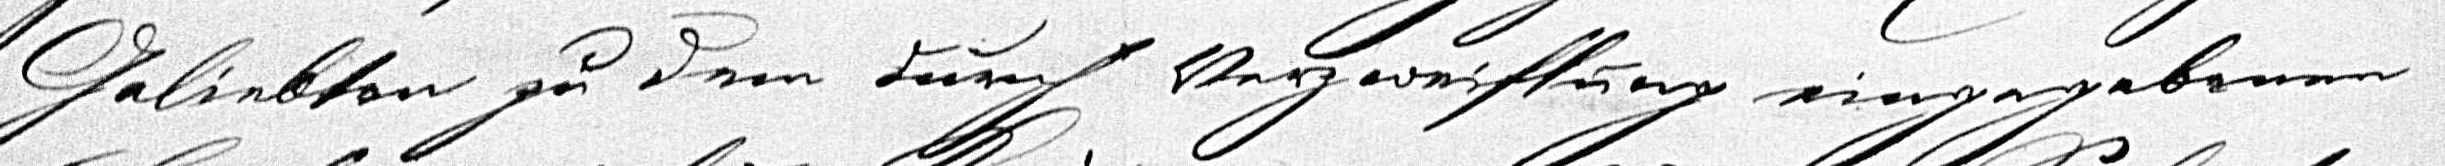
Geliebten zu dem durch Verzweiflung eingegebenen
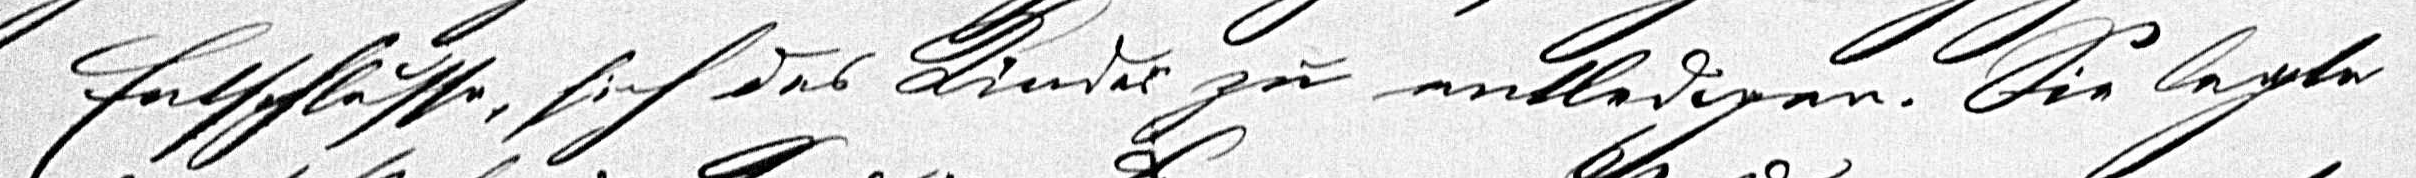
Entschlusse, sich des Kindes zu entledigen. Sie legte
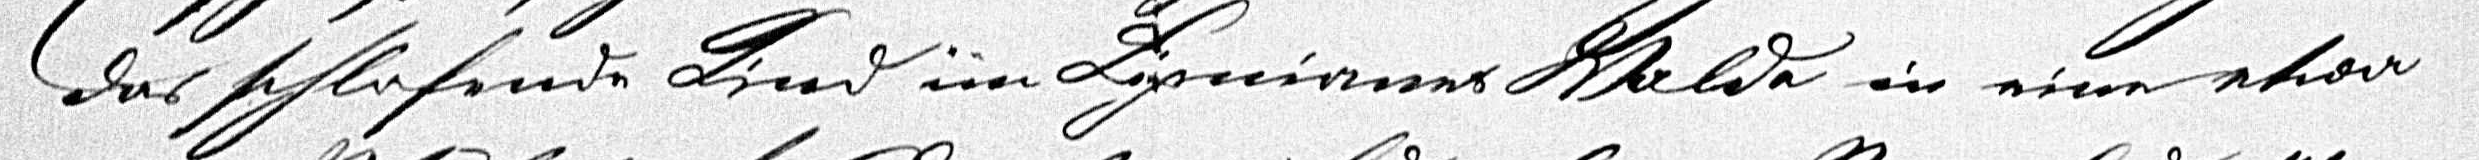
das schlafende Kind im Lipnianer Walde in eine etwa
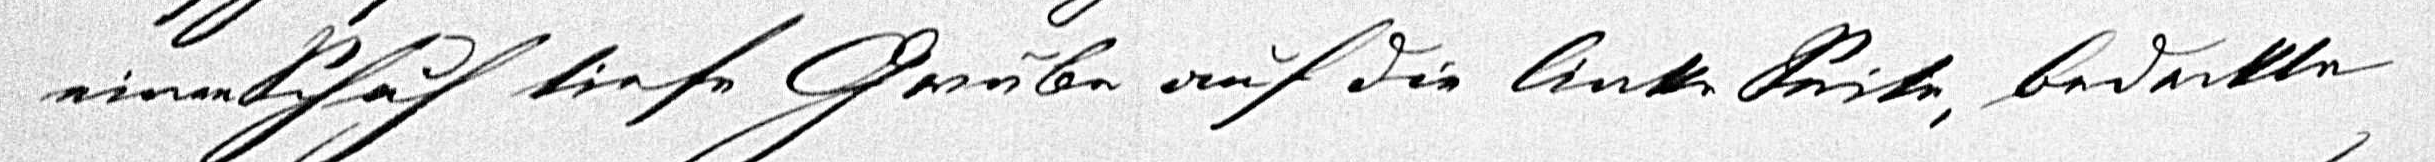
einen Schuh tiefe Grube auf die linke Seite, bedeckte
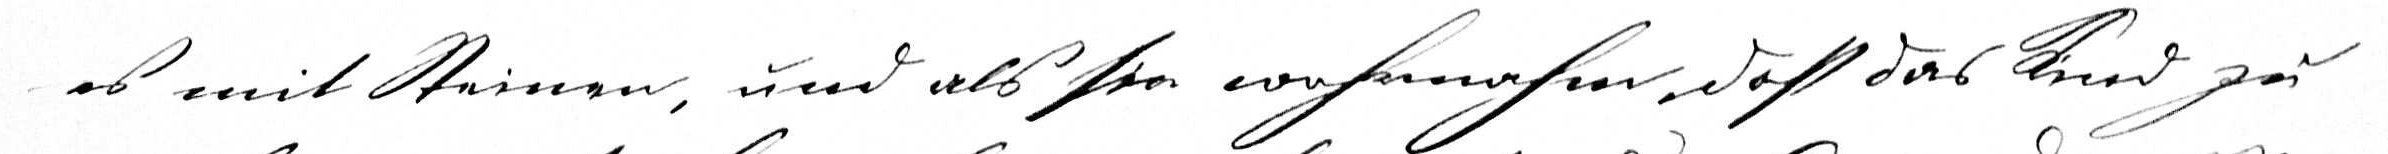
es mit Steinen, und als sie wahrnahm, daß das Kind zu
